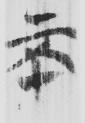不
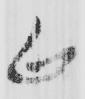㠯（以）
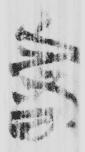時
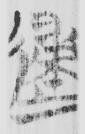{辶帚}
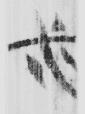必
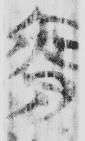夜
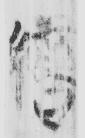{糸帝口}
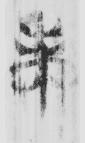奉
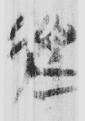道
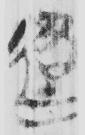{辶各}
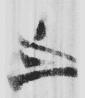之
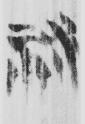{示朮}
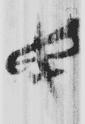民
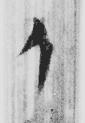人
